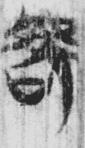唬（乎）
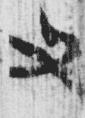又（有）
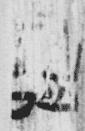○（喑）
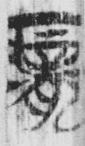聾
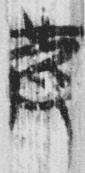皮（跛）
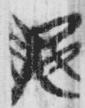○（癭）
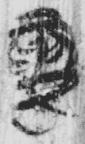婁（僂）
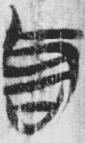○（始）
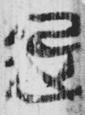○（起）
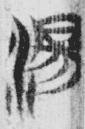湯
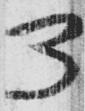乃
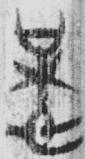悔（謀）
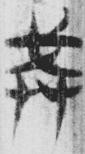戒
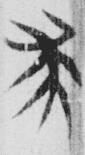求
